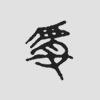虘B
